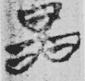晶
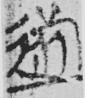○（旅）
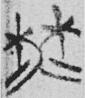焚
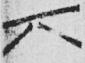亓（其）
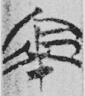○（釐）
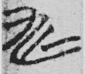○（喪）
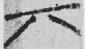亓（其）
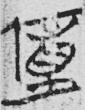僮（童）
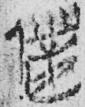○（僕）
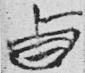貞
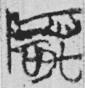礪
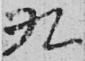九
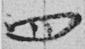四
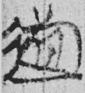○（旅）
